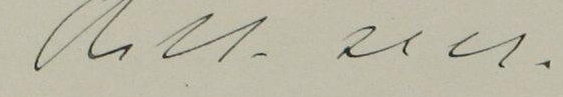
Ritt. secr.
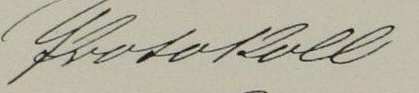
Protokoll
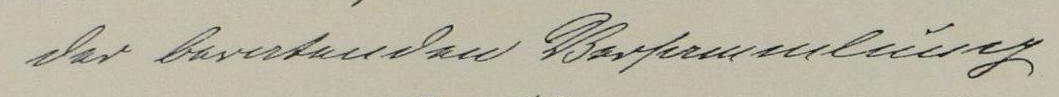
der beratenden Versammlung
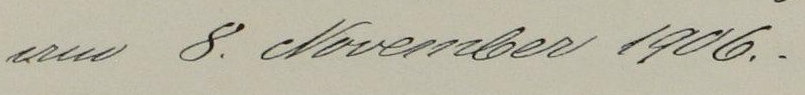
am 8. November 1906.
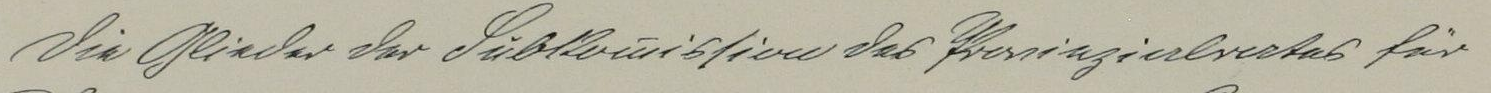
Die Glieder der Subkommission des Provinzialrates für
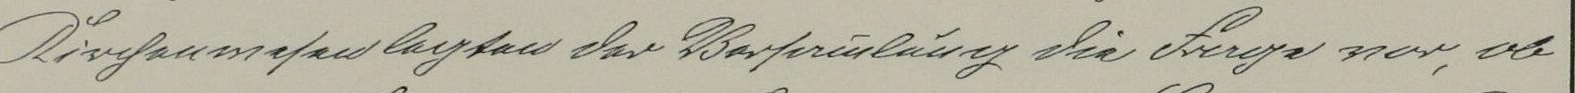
Kirchenwesen legten der Versammlung die Frage vor, ob
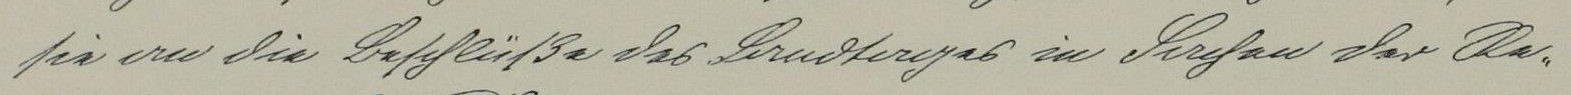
sie an die Beschlüße des Landtages in Sachen der Re-
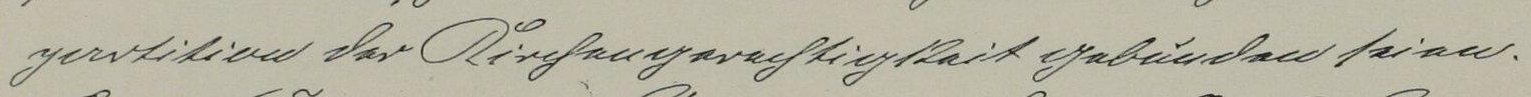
partition der Kirchengerechtigkeit gebunden seien.
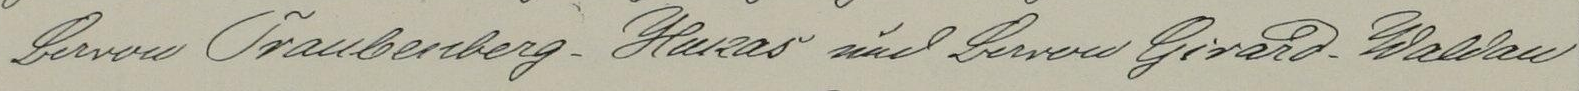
Baron Traubenberg-Hukas und Baron Girard-Waldau
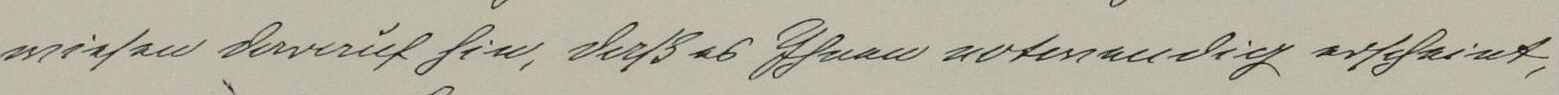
wiesen darauf hin, daß es Ihnen notwendig erscheint,
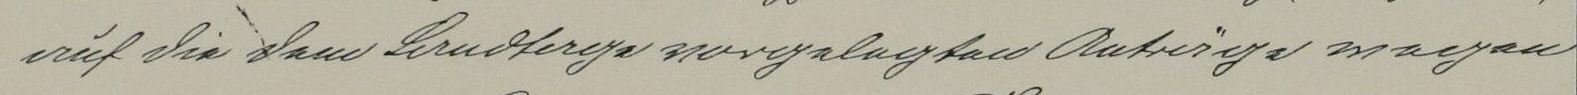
auf die dem Landtage vorgelegten Anträge wegen
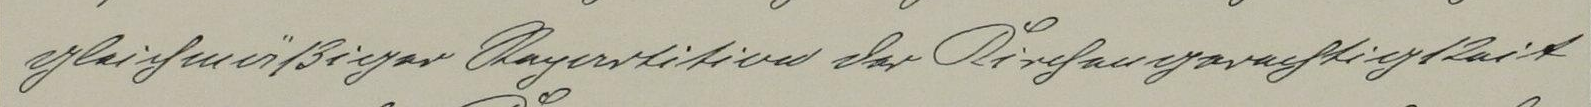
gleichmäßiger Repartition der Kirchengerechtigkeit
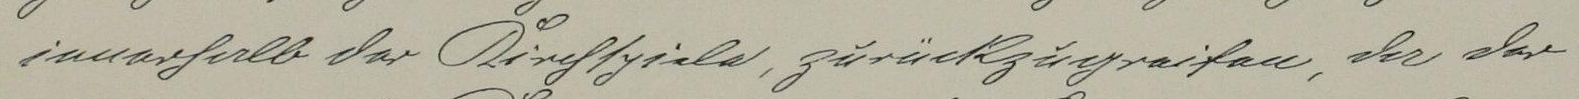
innerhalb der Kirchspiele, zurückzugreifen, da der
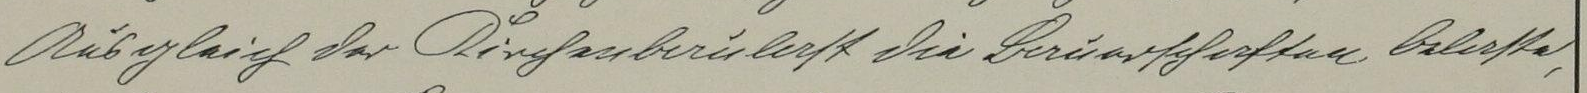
Ausgleich der Kirchenbaulast die Bauerschaften belaste,
